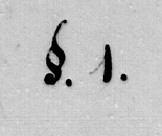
§. 1.
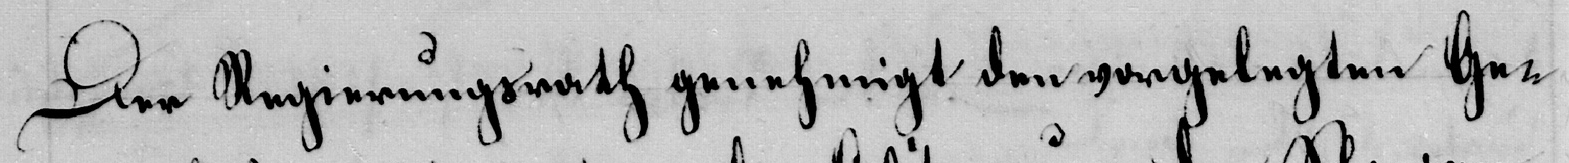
Der Regierungsrath genehmigt den vorgelegten Ge¬
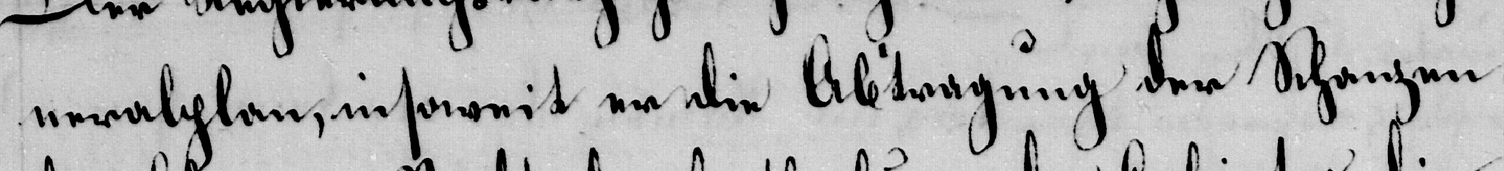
neralplan, insoweit er die Abtragung der Schanzen
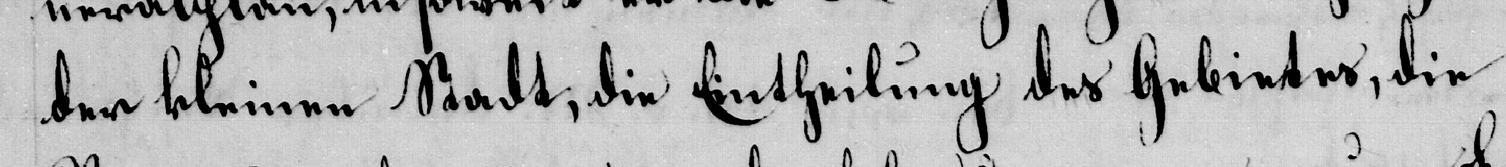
der kleinen Stadt, die Eintheilung des Gebietes, die
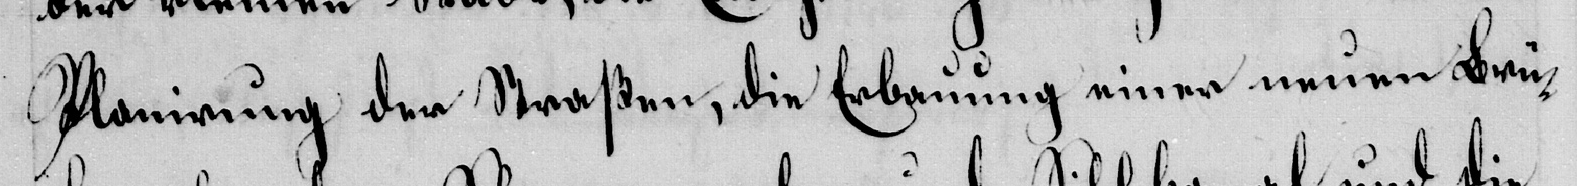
Planirung der Straßen, die Erbauung einer neuen Brü¬
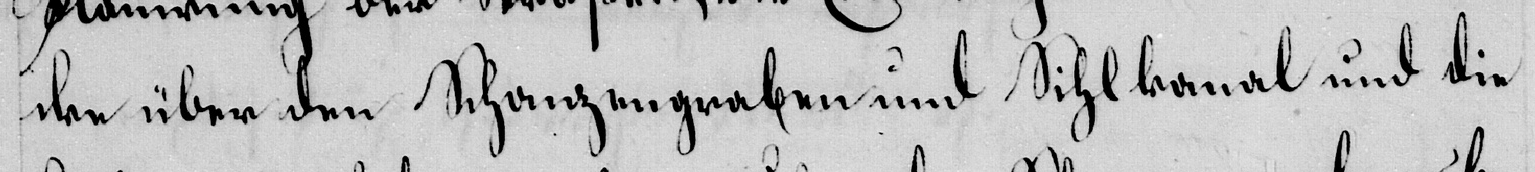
cke über den Schanzengraben und Sihlkanal und die
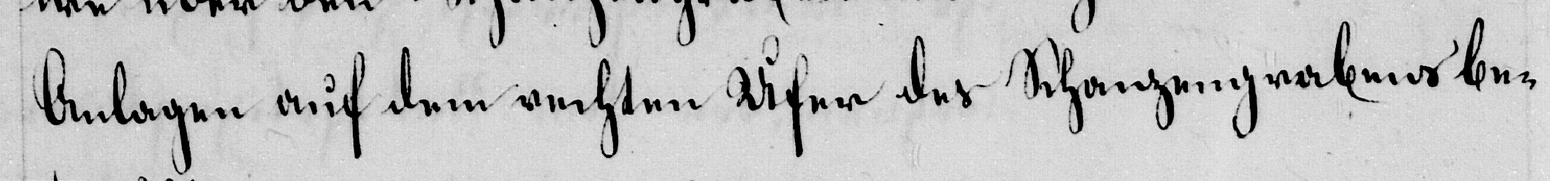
Anlagen auf dem rechten Ufer des Schanzengrabens be¬
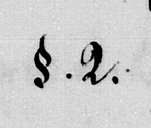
§. 2.
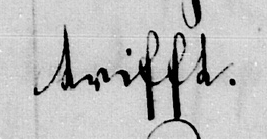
trifft.
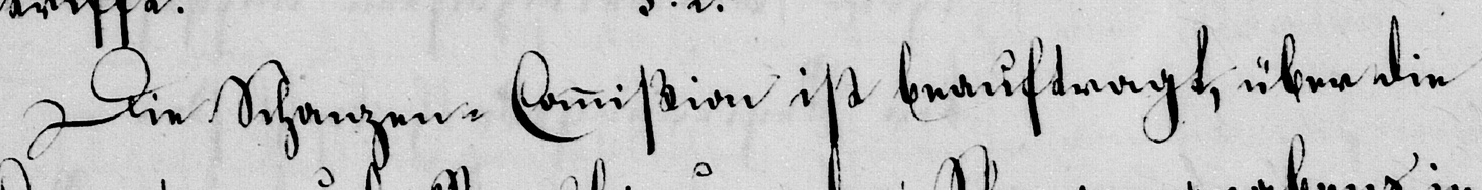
Die Schanzen-Commißion ist beauftragt, über die
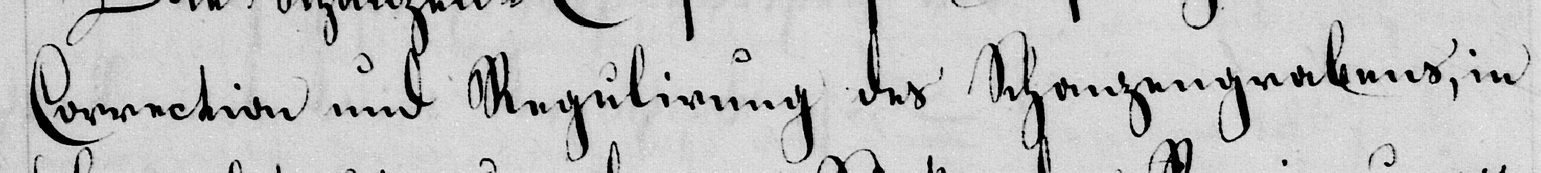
Correction und Regulirung des Schanzengrabens, in
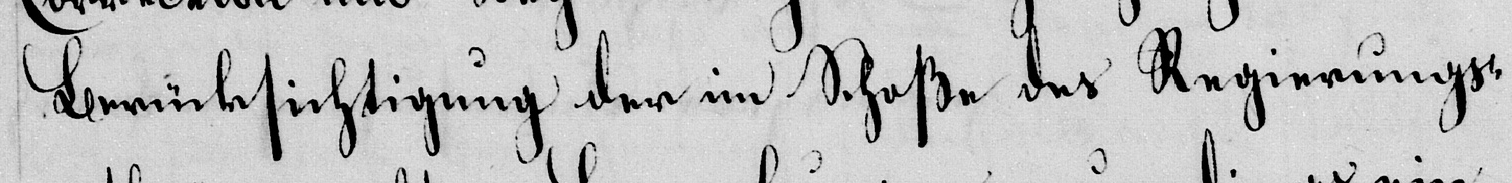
Berücksichtigung der im Schoße des Regierungs¬
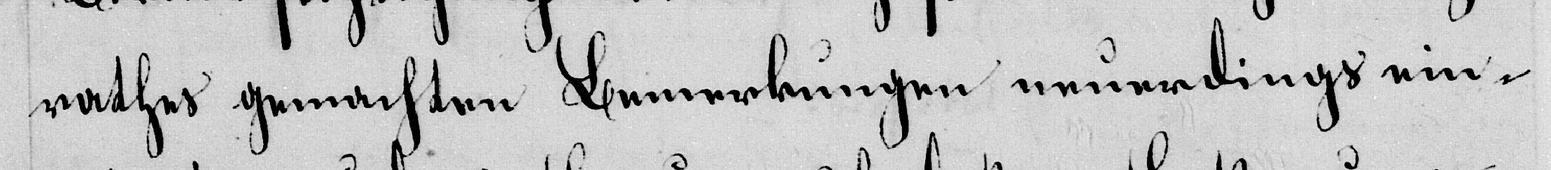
rathes gemachten Bemerkungen neuerdings ein¬
